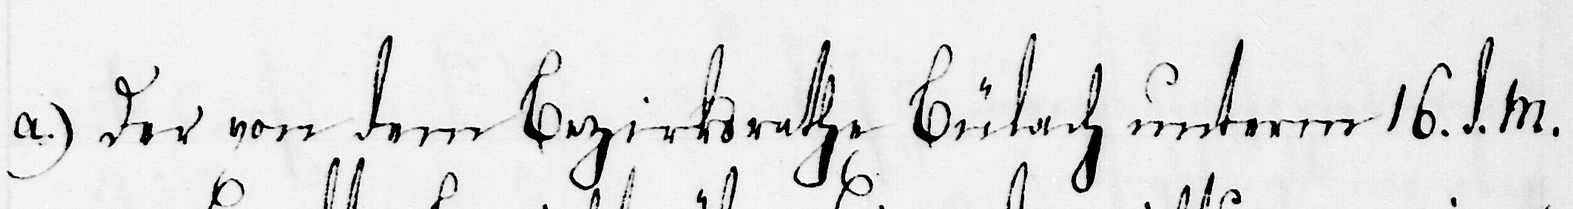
a.) Der von dem Bezirksrathe Bülach unterm 16. d. M.
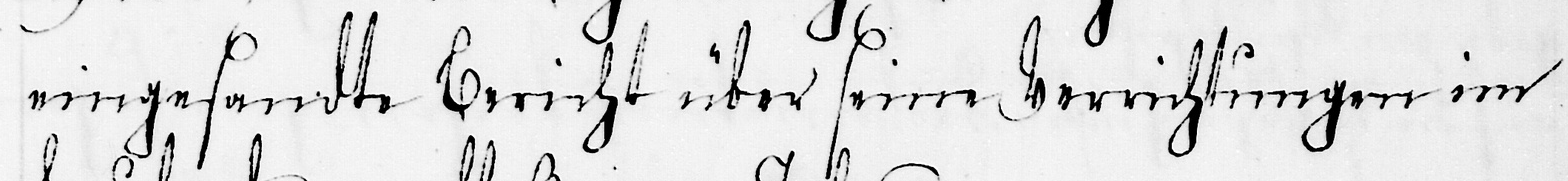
eingesandte Bericht über seine Verrichtungen im
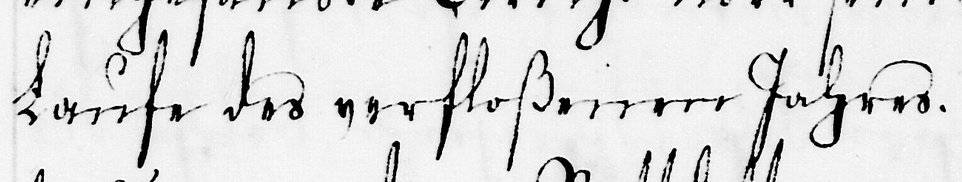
Laufe des verfloßenen Jahres.
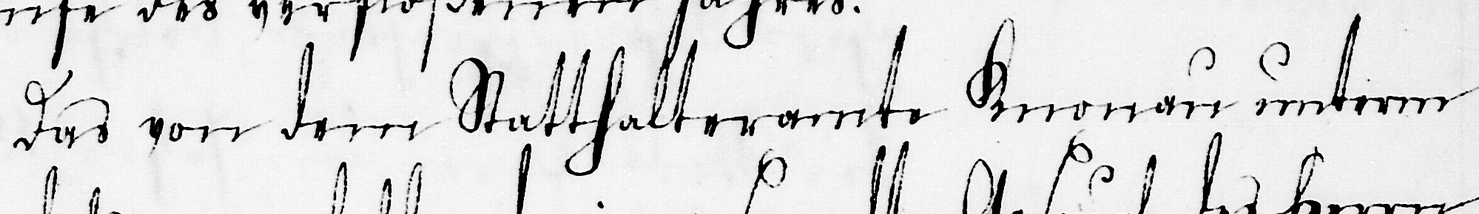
Das von dem Statthalteramte Knonau unterm
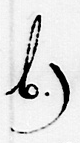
b.)
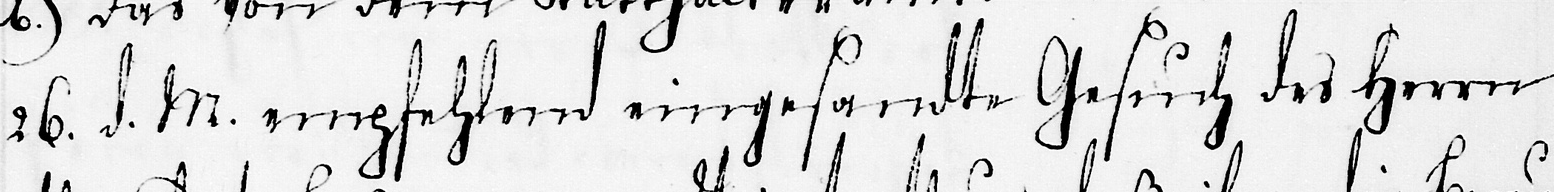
26. d. M. empfehlend eingesandte Gesuch des Herrn
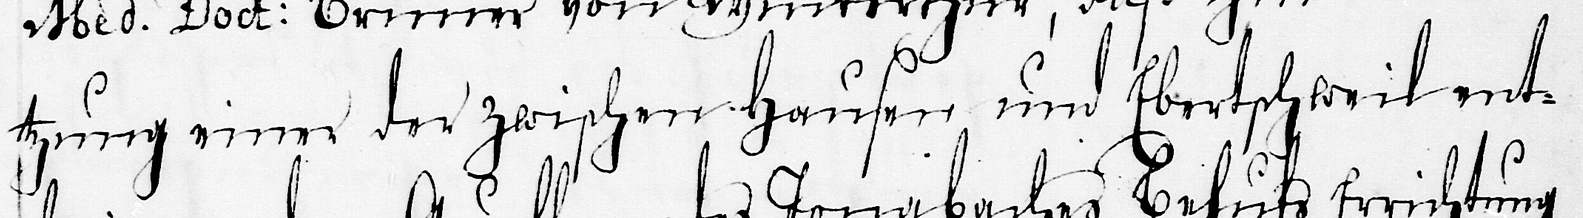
tzung einer der zwischen Hausen und Ebertschweil ent¬
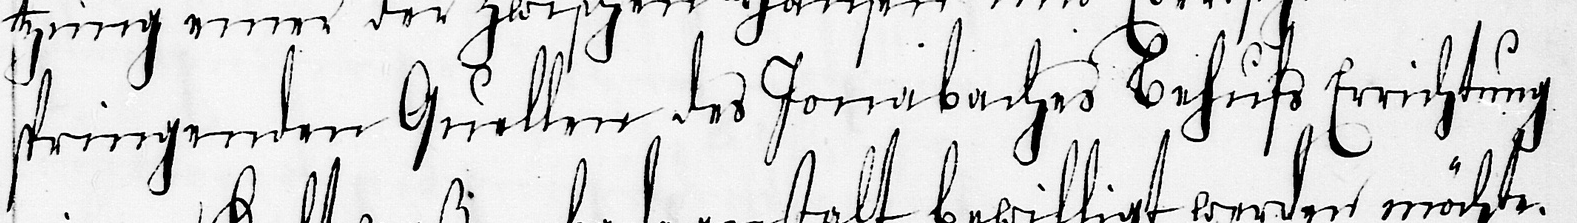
springenden Quellen des Jonabaches Behufs Errichtung
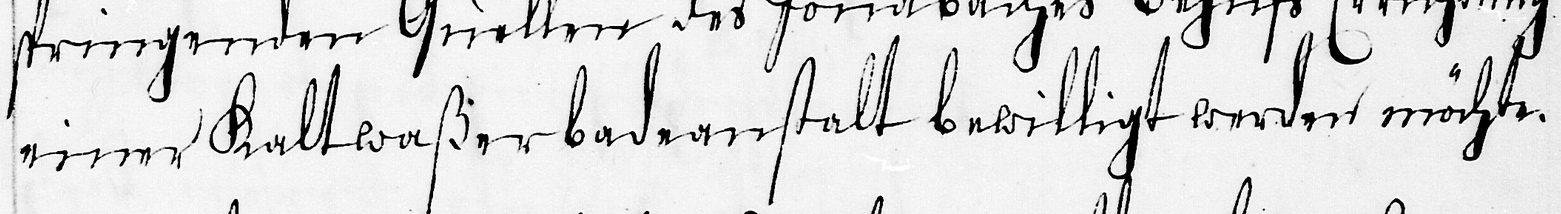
einer Kaltwaßerbadeanstalt bewilligt werden möchte.
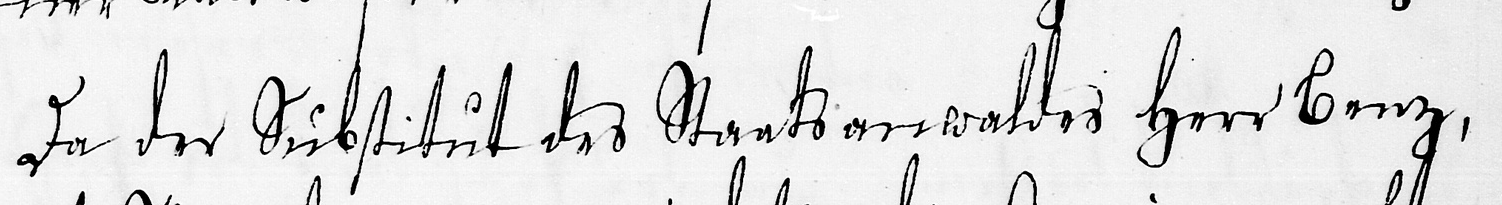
Da der Substitut des Staatsanwaldes Herr Benz,
